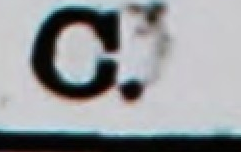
C.
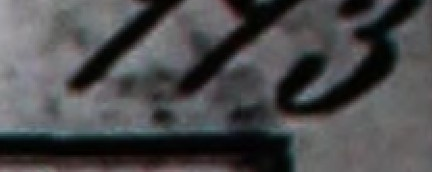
773
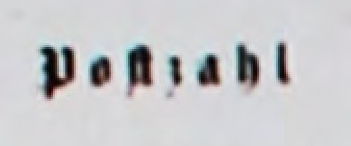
Postzahl
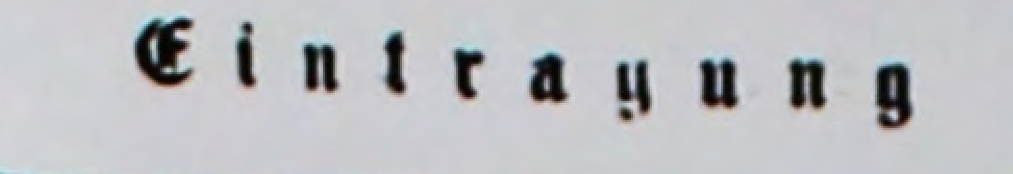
Eintragung
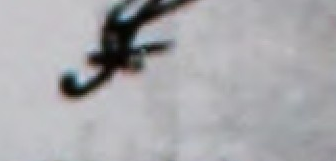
F
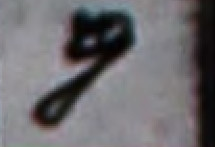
G
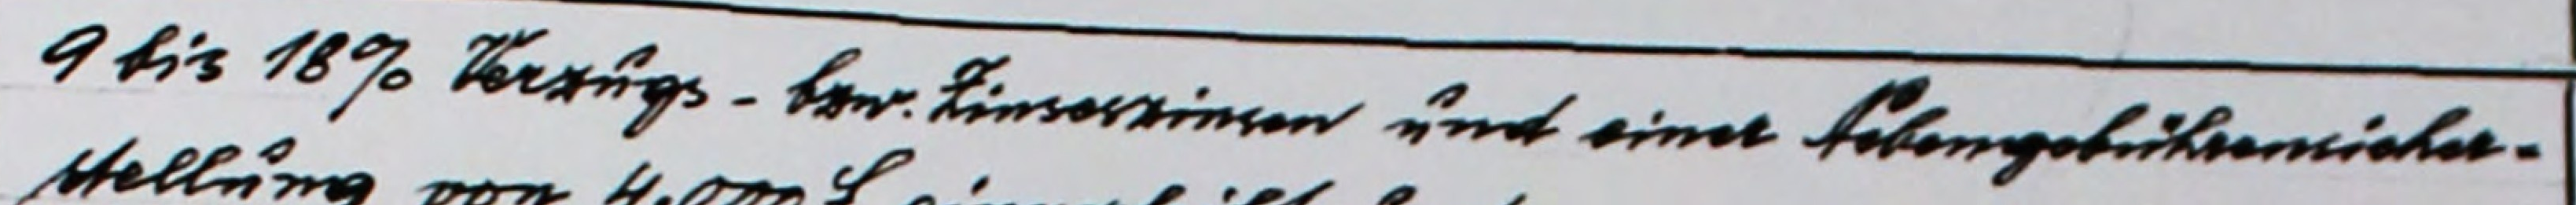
9 bis 18 % Verzugs - bzw. Zinseszinsen und einer Nebengebührensicher=
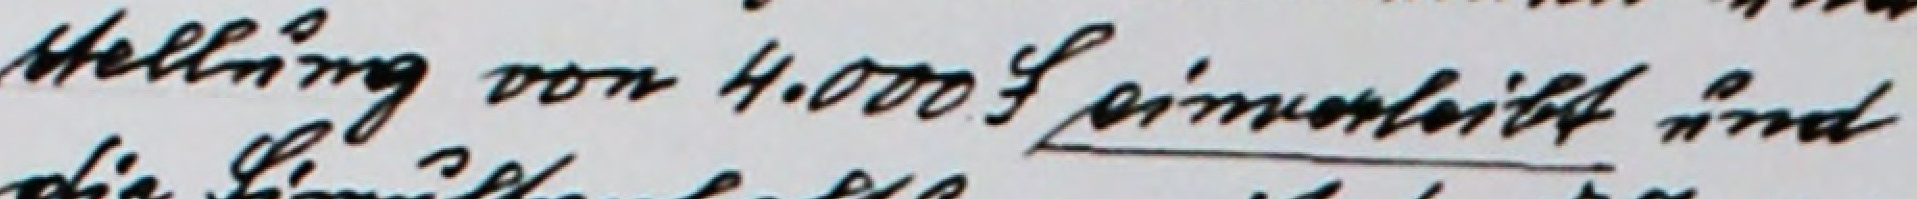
stellung von 4.000 F einverleibt und
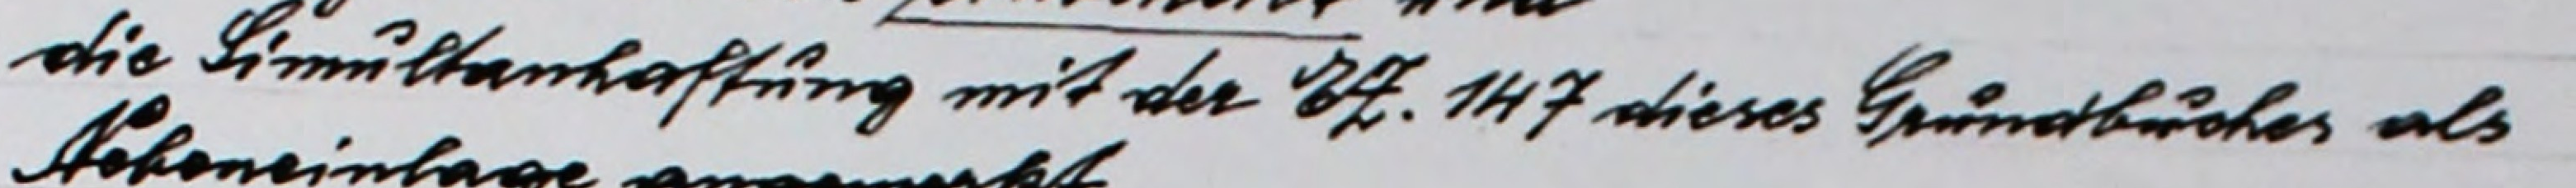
die Simultanhaftung mit der EZ. 147 dieses Grundbuches als
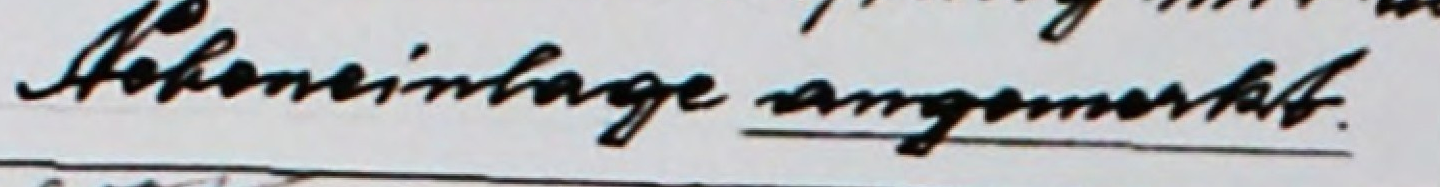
Nebeneinlage angermerkt.
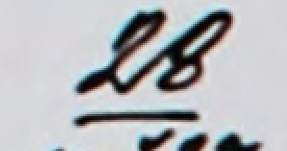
28
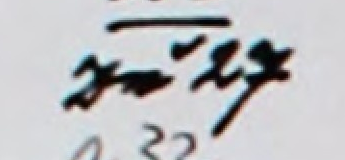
zu 27
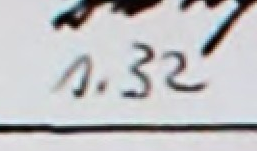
s. 32
